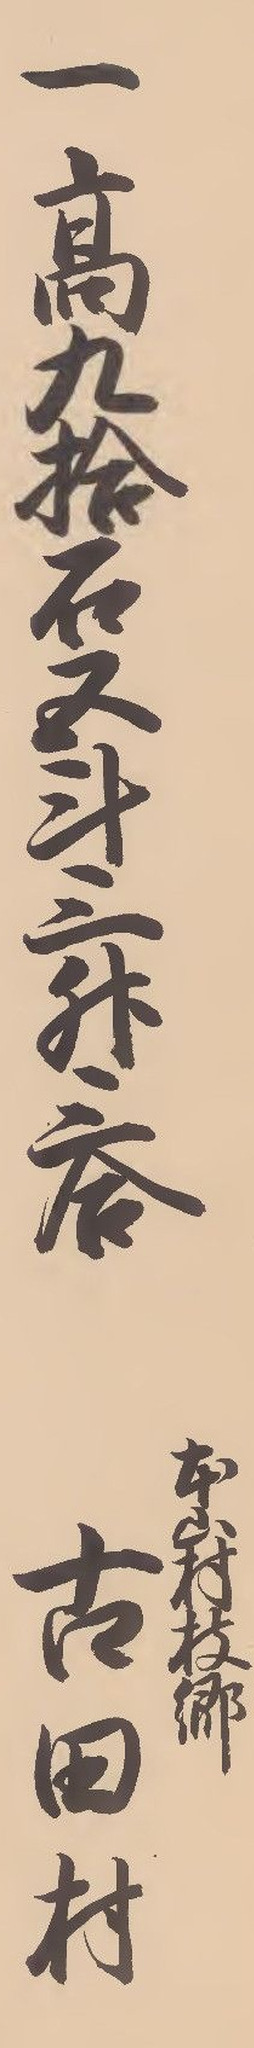一髙九拾石五斗三升三合古田村
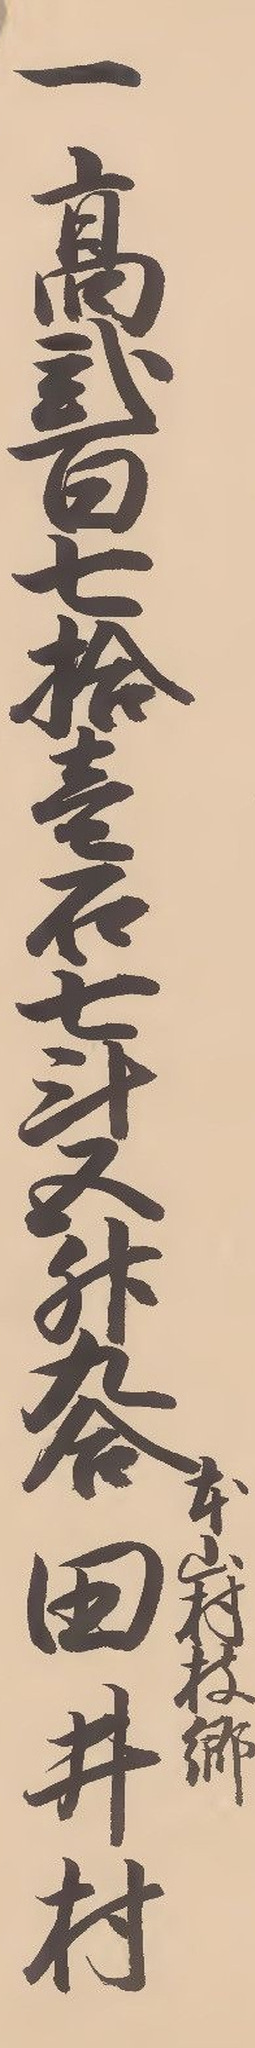一髙弐百七拾壱石七斗五升九合田井村
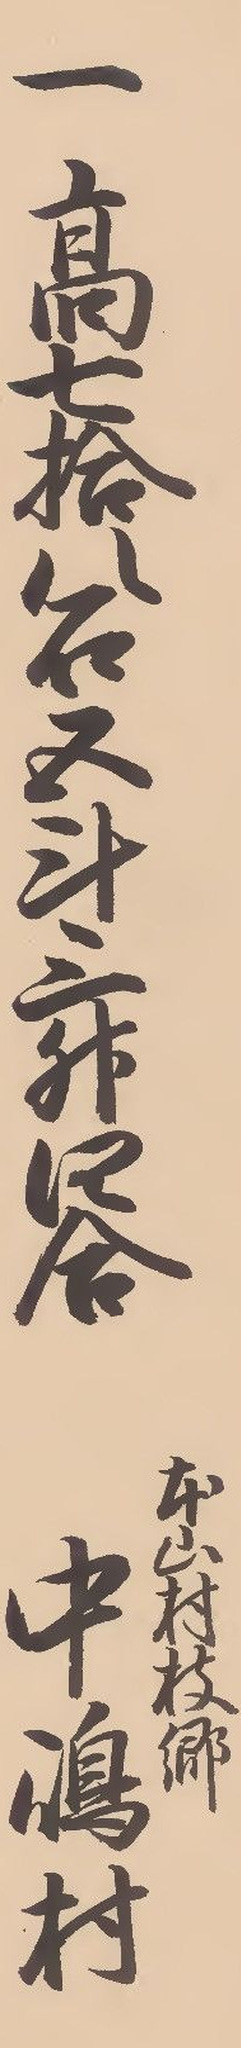一髙七拾八石五斗三升四合中嶋村
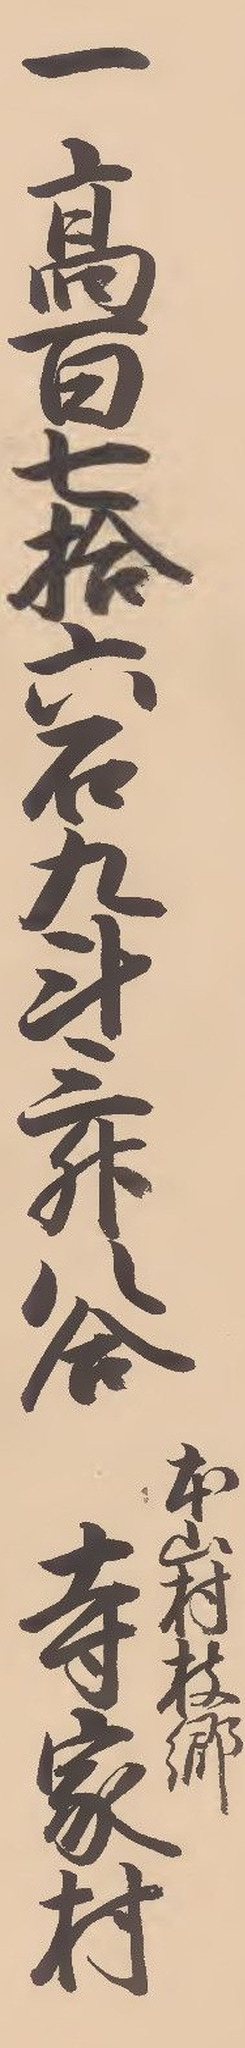一髙百七拾六石九斗三升八合寺家村
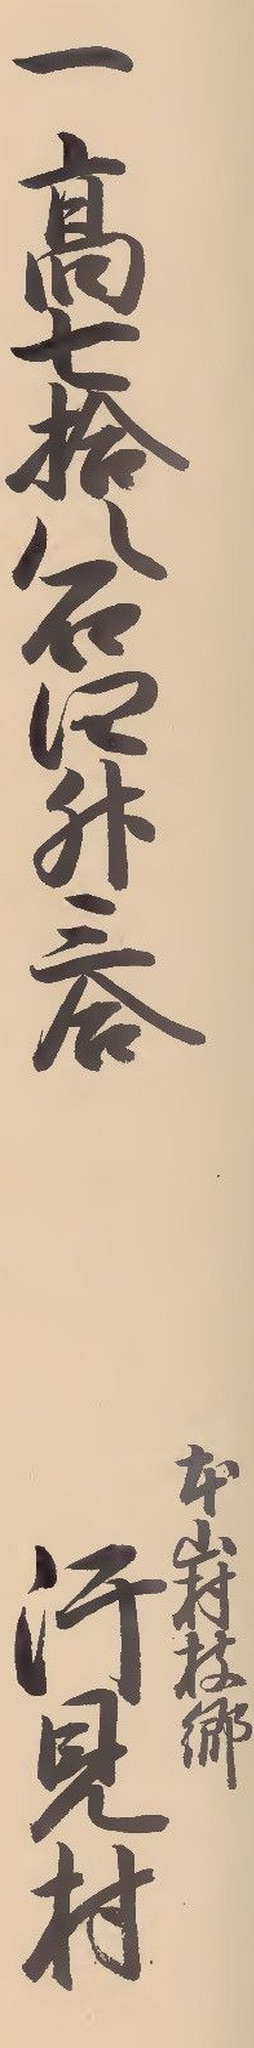一髙七拾八石四升三合汗見村
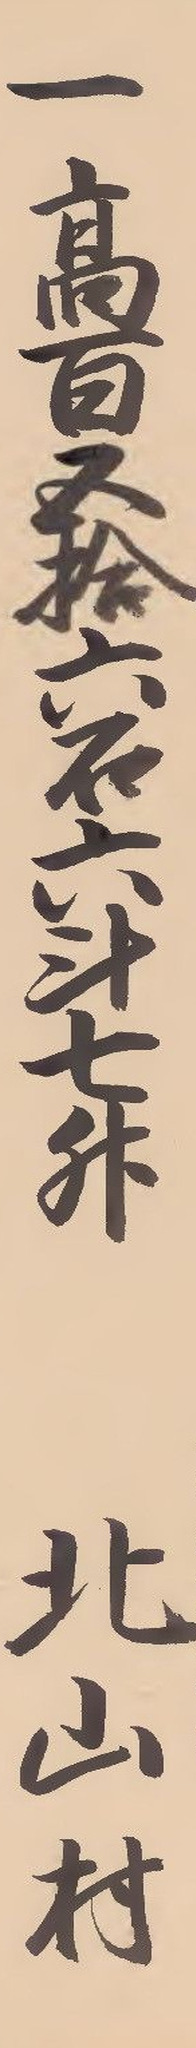一髙百五拾六石六斗七升北山村
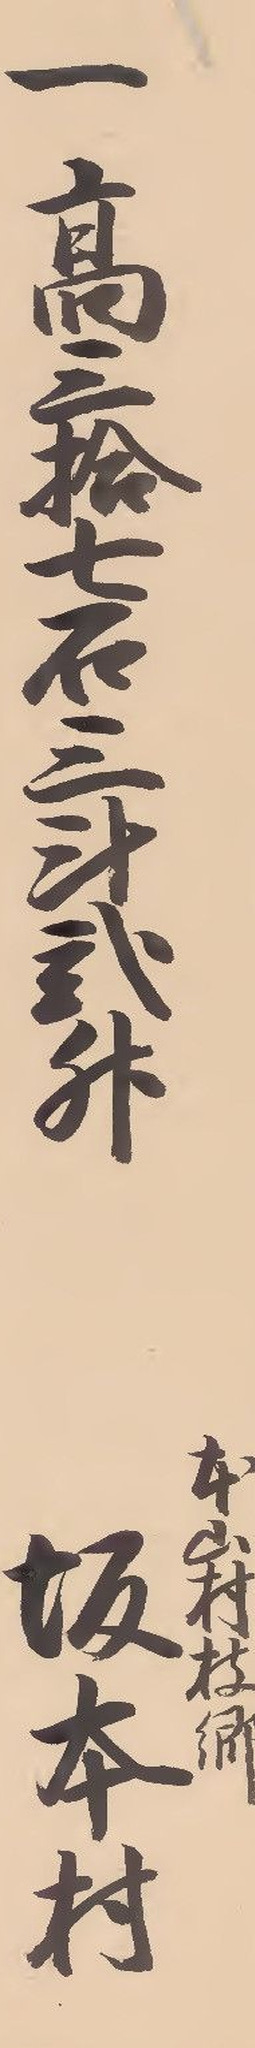一髙三拾七石三斗弐升坂本村
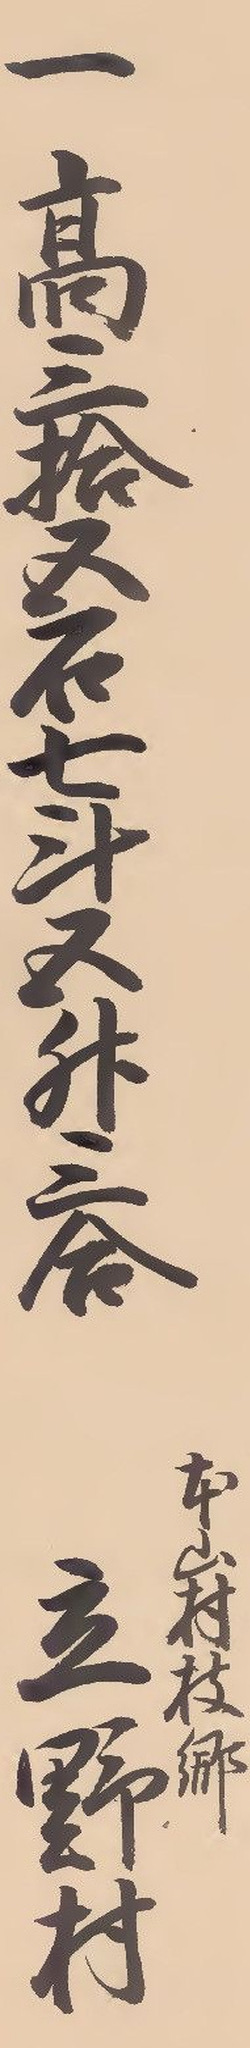一髙三拾五石七斗五升三合立野村

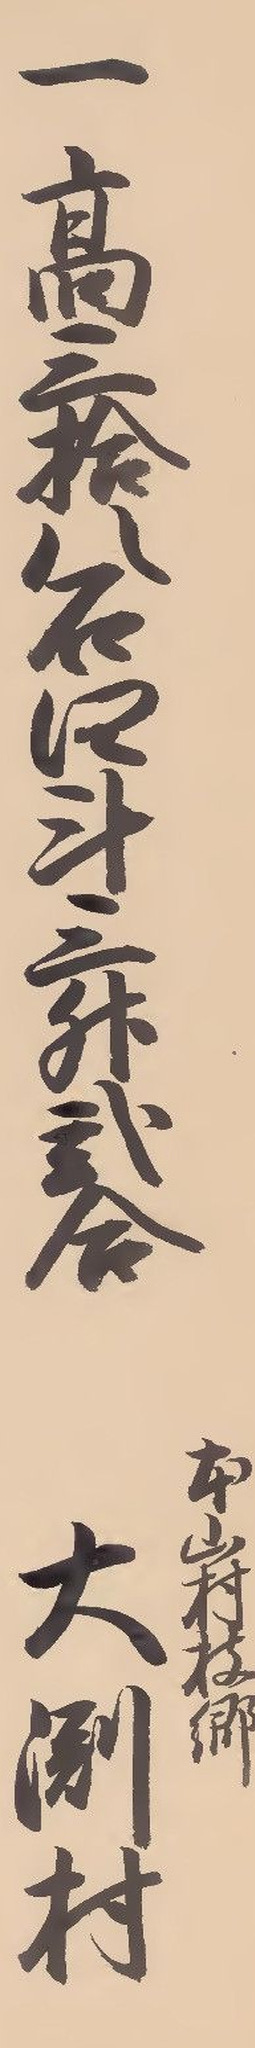一髙三拾八石四斗三升弐合大渕村
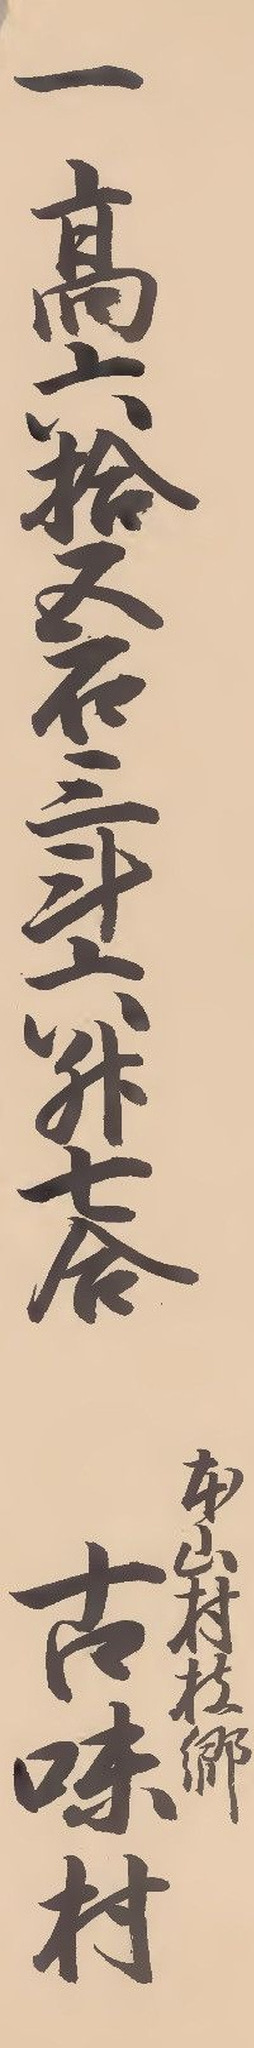一髙六拾五石三斗六升七合古味村
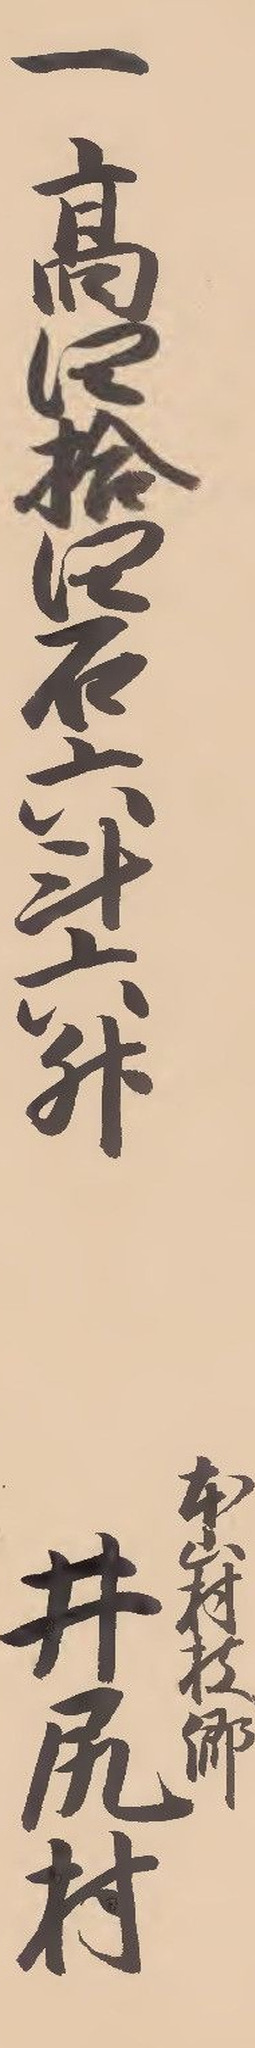一髙四拾四石六斗六升井尻村
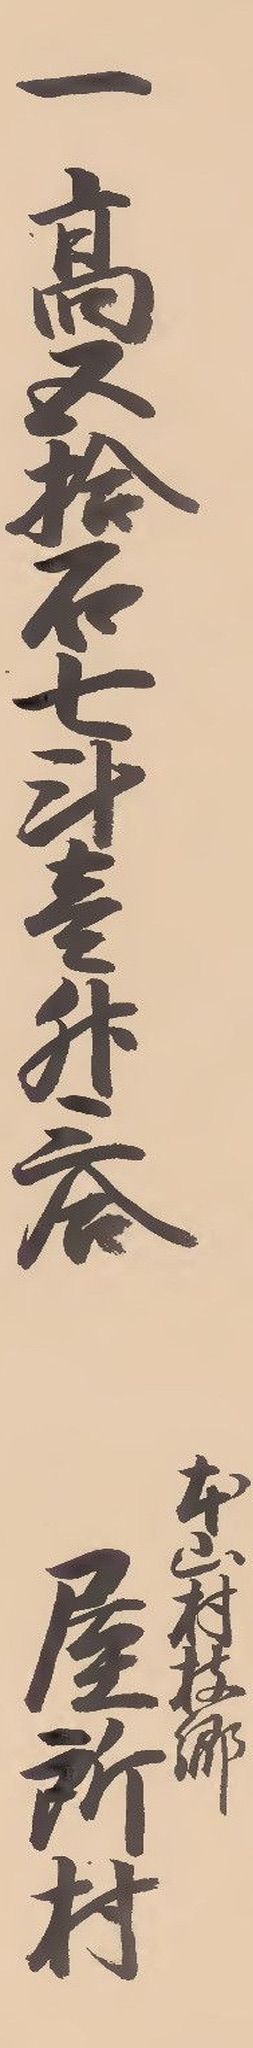一髙五拾石七斗壱升三合屋所村
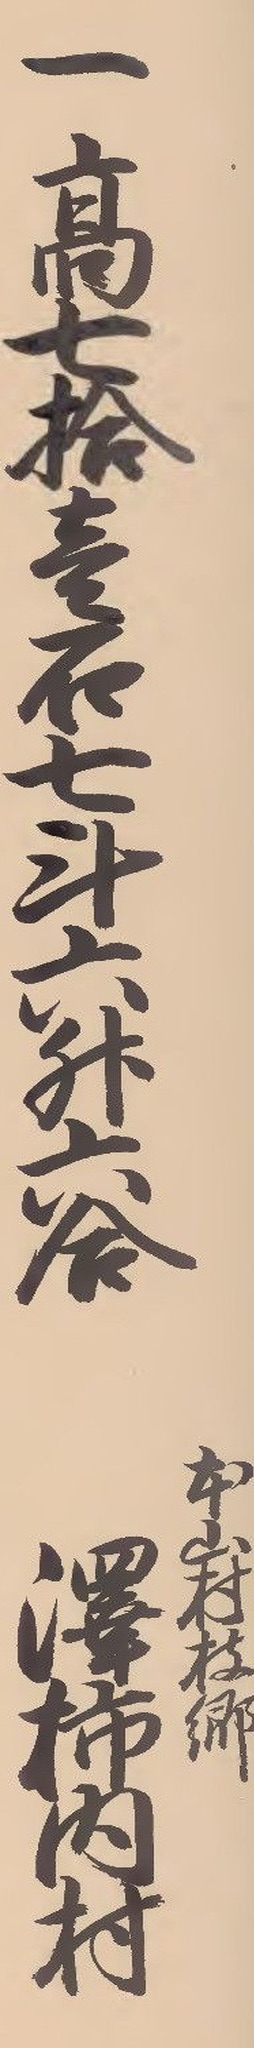一髙七拾壱石七斗六升六合澤柿内村
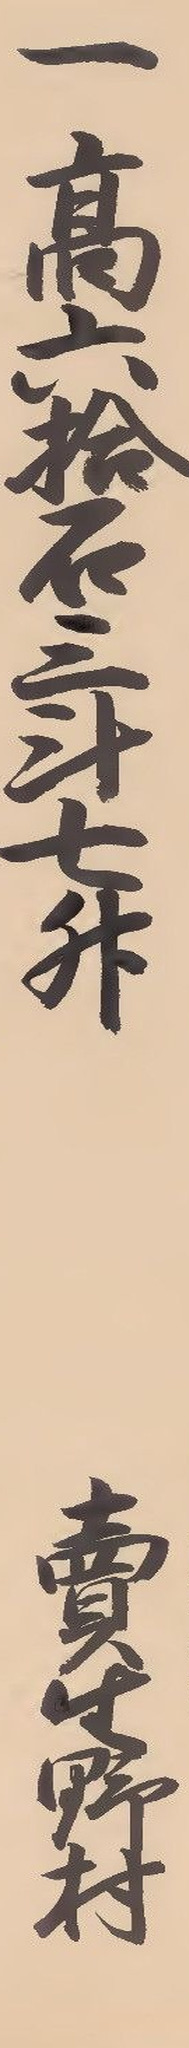一髙六拾石三斗七升買生野村
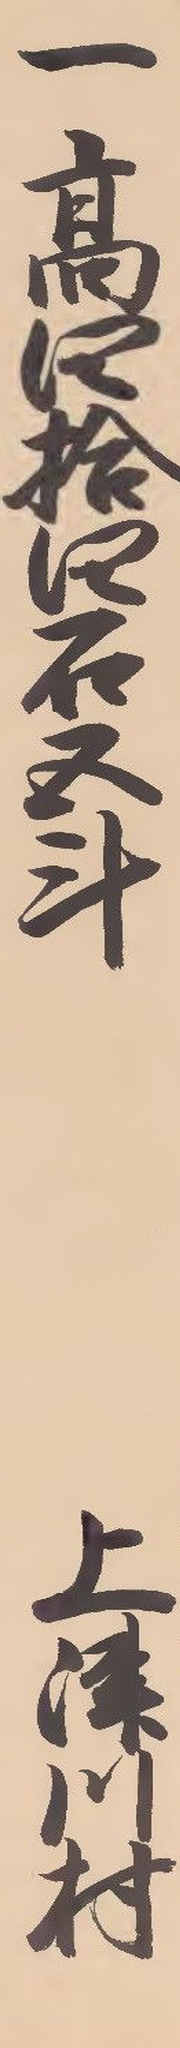一髙四拾四石五斗上津川村

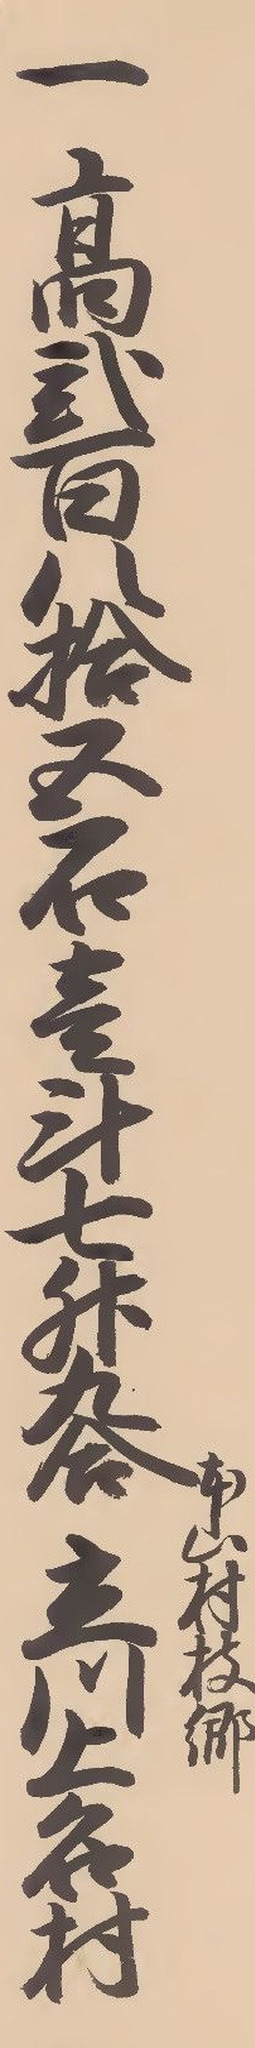一髙弐百八拾五石壱斗七升九合立川上名村
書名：土佐国郷帳
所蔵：国立公文書館 National Archives of Japan
